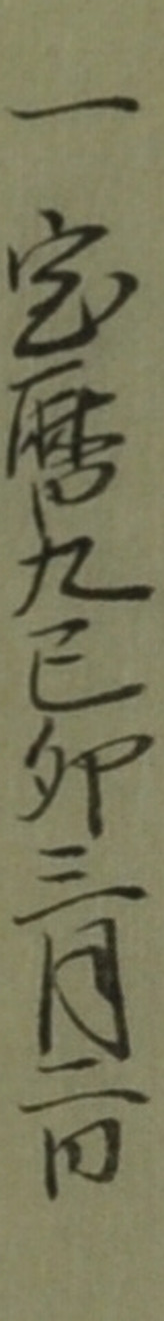一宝暦九己卯三月二日
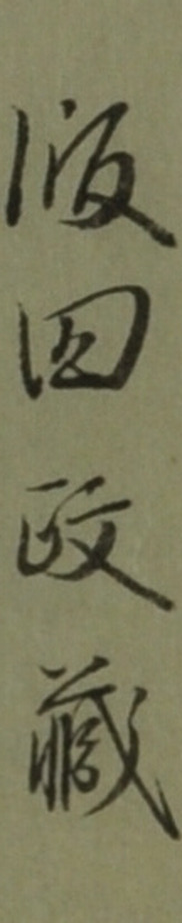飯田政蔵
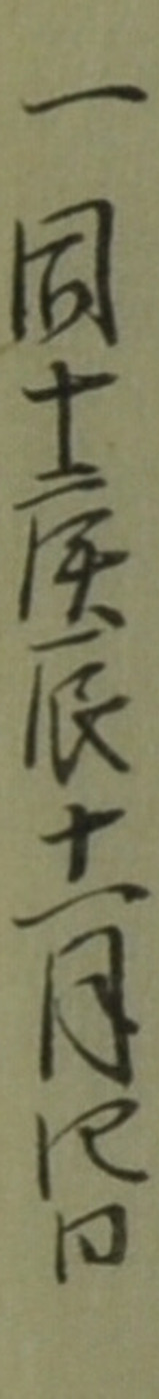一同十庚辰十一月四日
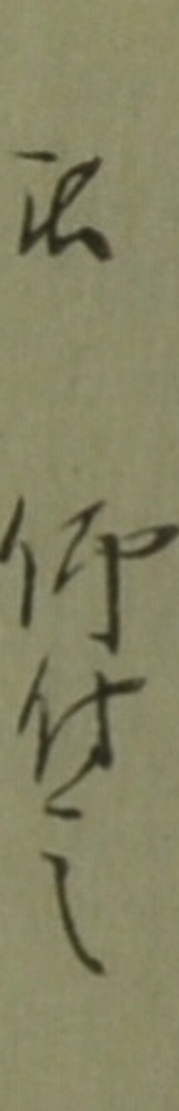被仰付之
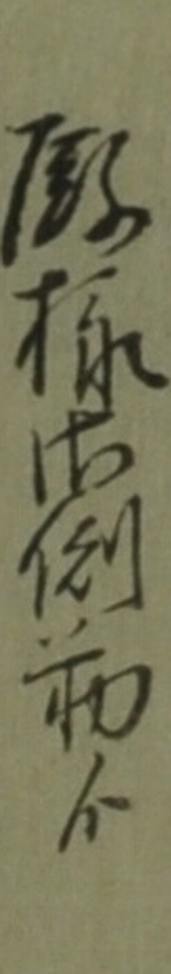殿様御側勤ゟ
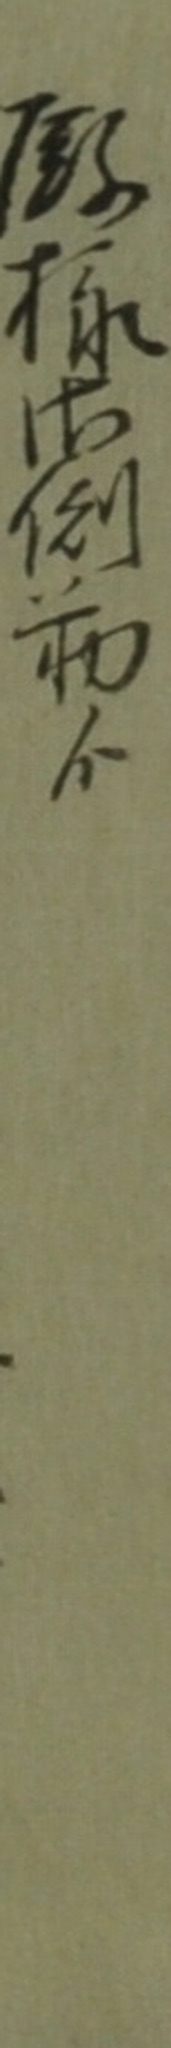殿様御側勤ゟ

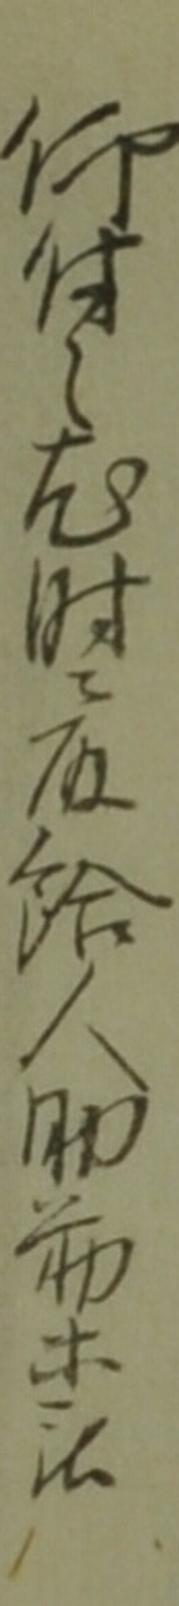仰付之尤時二取給人助勤等被
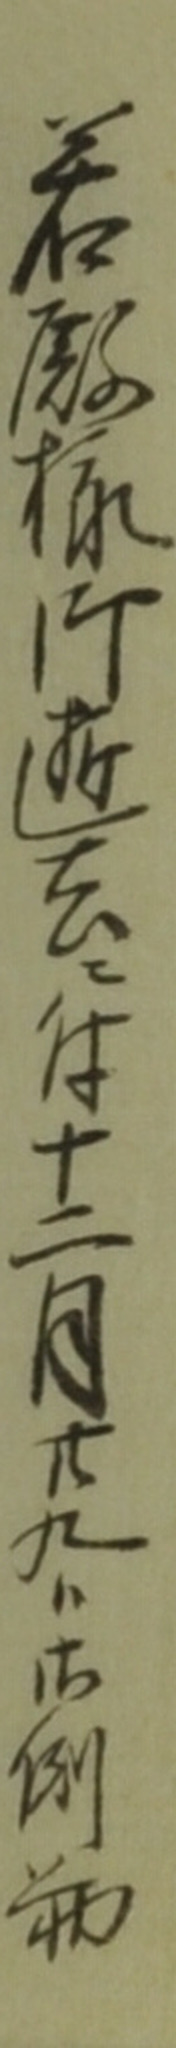若殿様御逝去ニ付十二月廿九日御側勤
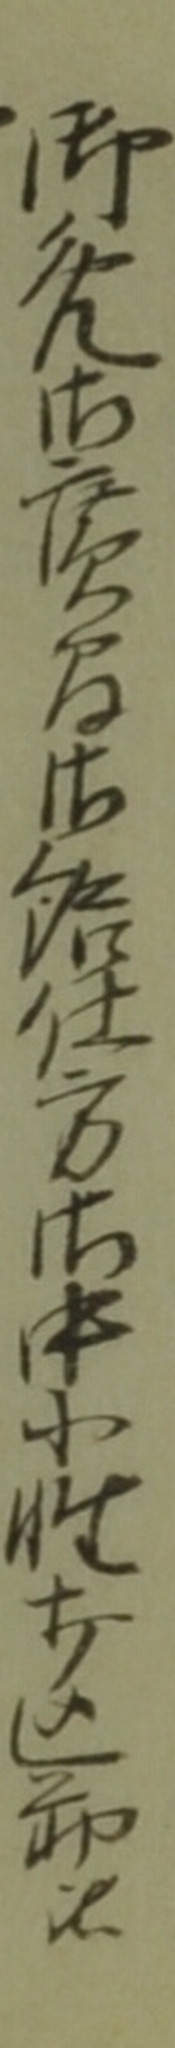御免御広間御給仕方御中小性打込勤被
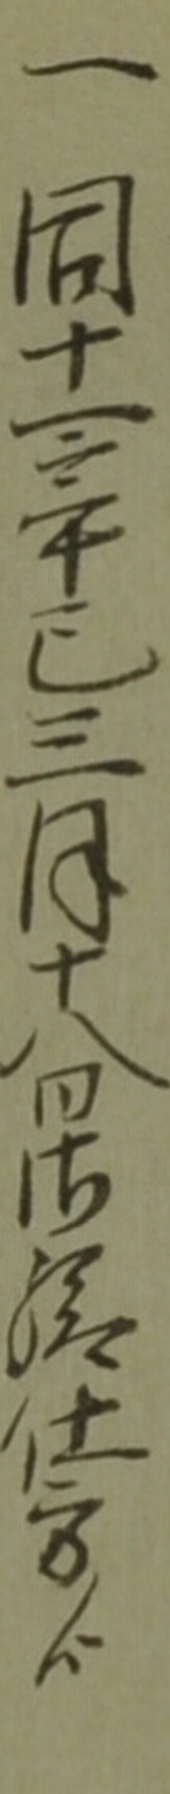一同十一辛巳三月十八日御給仕方ゟ
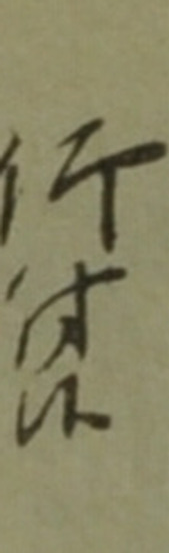仰付候
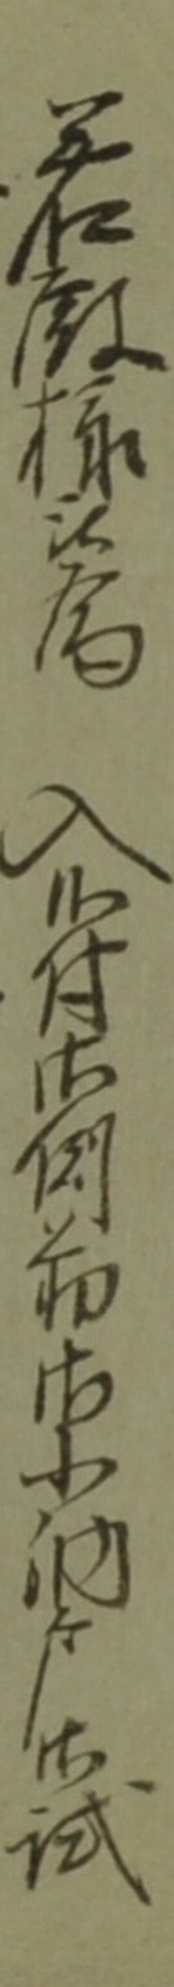若殿様被為入候付御側勤御小納戸御試
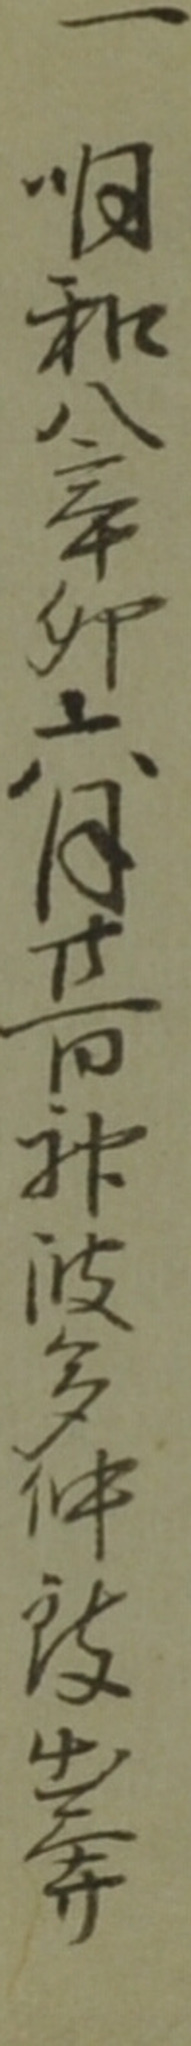一明和八辛卯六月廿一日神波多仲致出奔
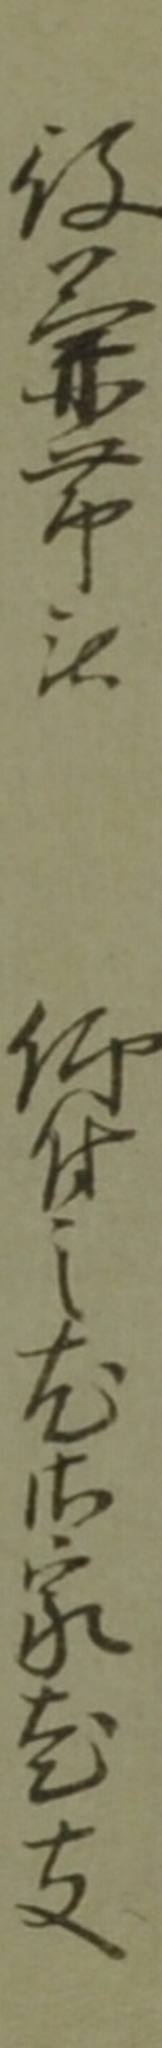役兼帯被仰付之尤御家老支
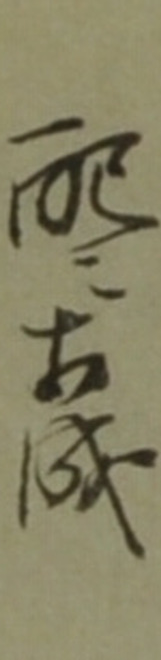配ニ相成
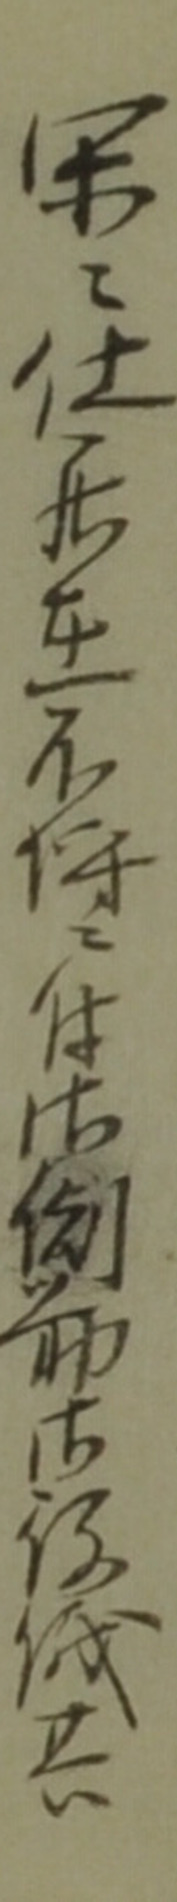閑ニ仕罷在不埒ニ付御側勤御役儀共
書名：諸御役代々録（四）
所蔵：伊那市立高遠町図書館・合同会社AMANE
